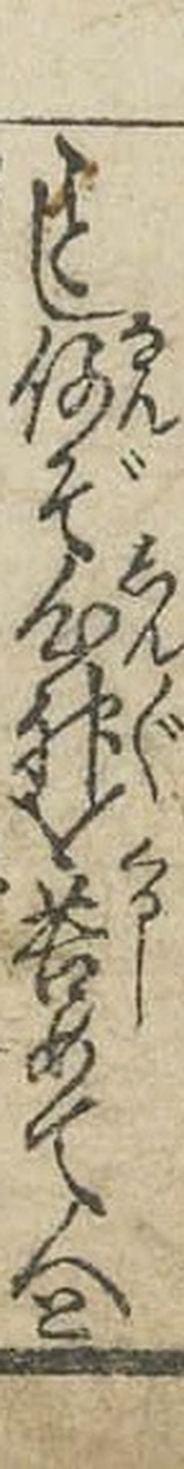ことし何ぞ心神を苦めて人と
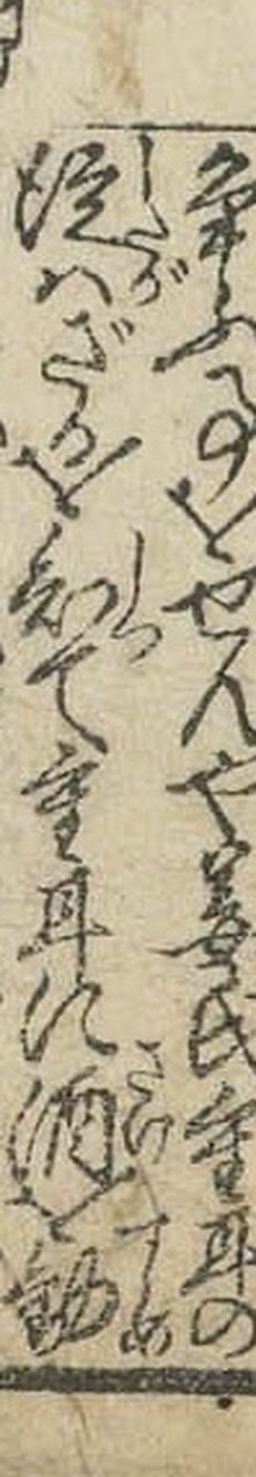従はざるを知て重耳に酒を勧
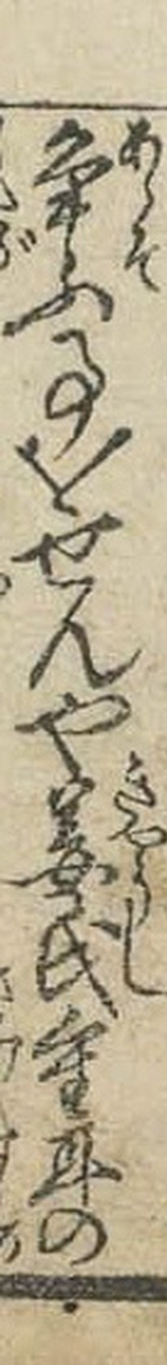争ふ事をせんや姜氏重耳の
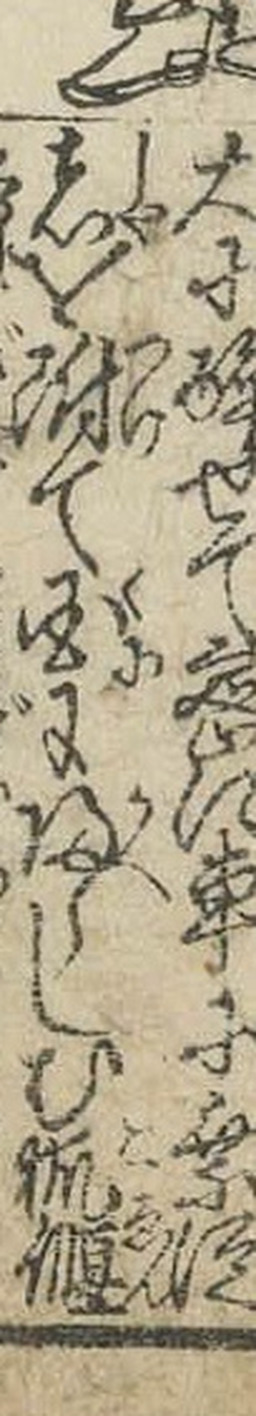者を付て国に帰らしむ孤偃
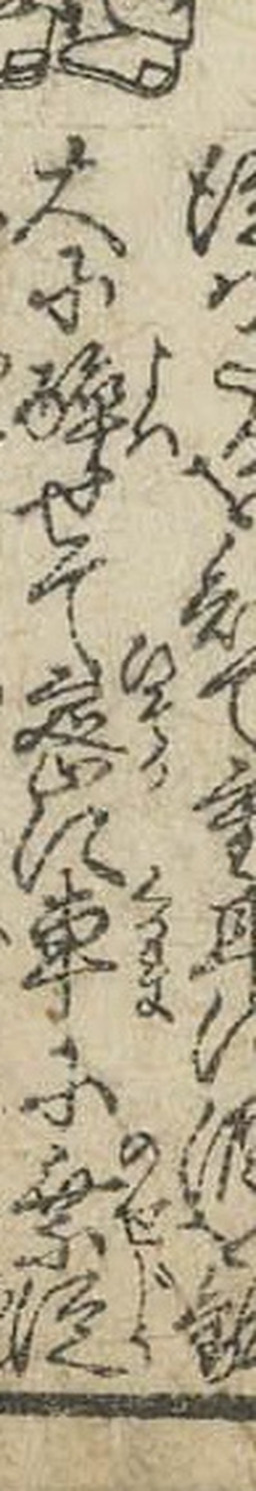大に醉せて密に車に乗従
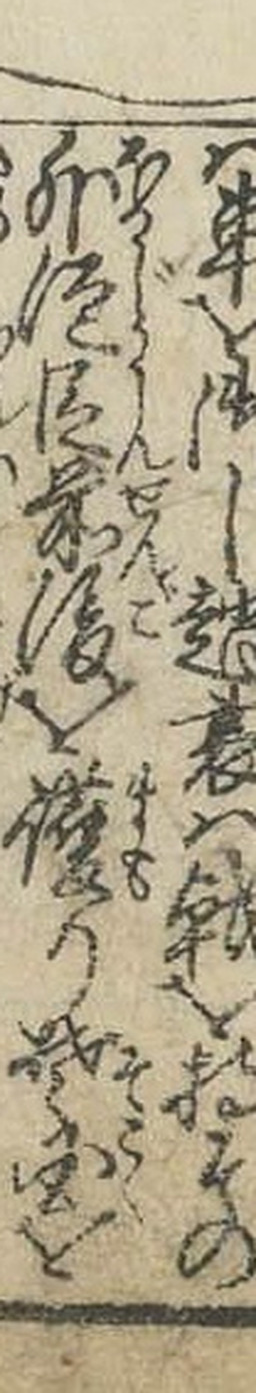外従臣前後を護り楚国を
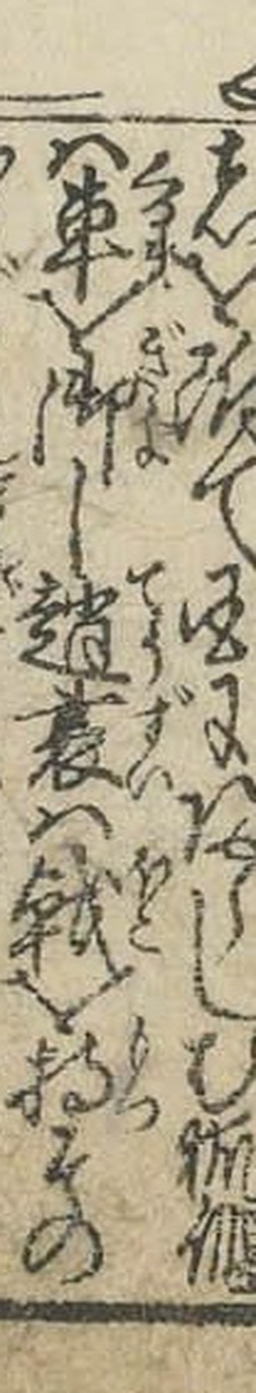は車を御し趙衰は戟を持その
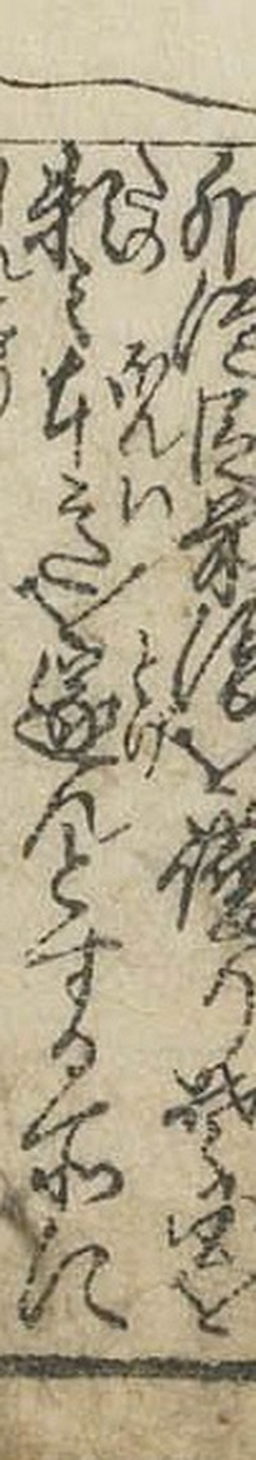頼み本意を遂んとする所に
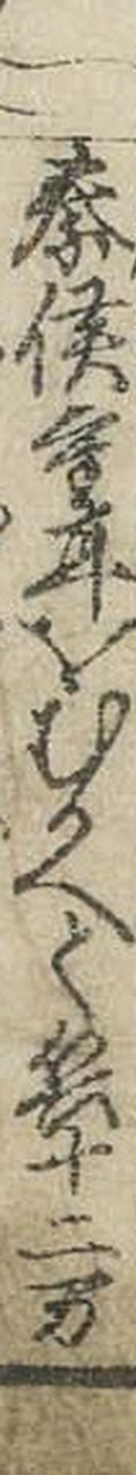秦侯重耳をむかへて兵十二万
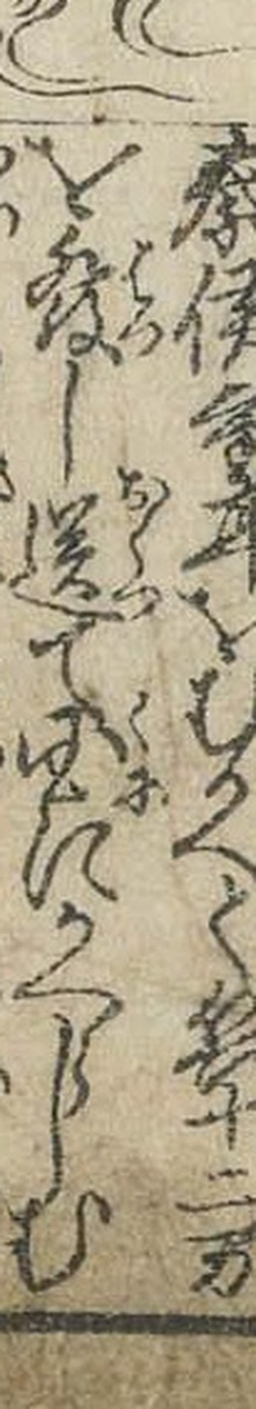を発し送て国にかへらしむ
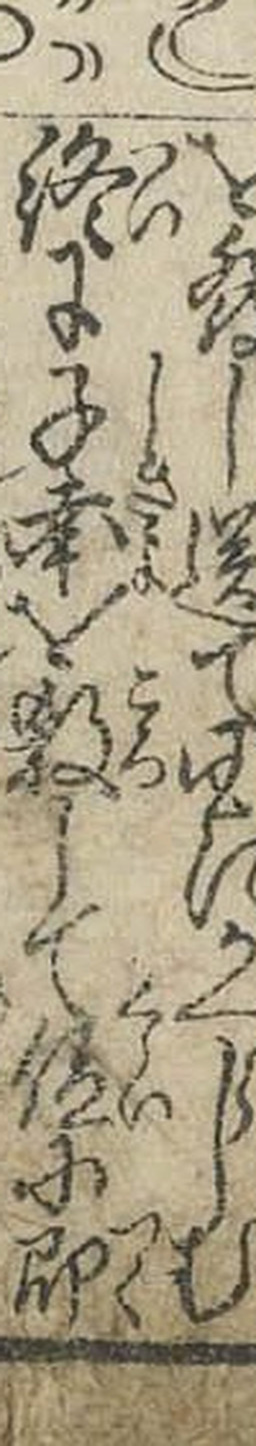終に子圉を殺して位に即
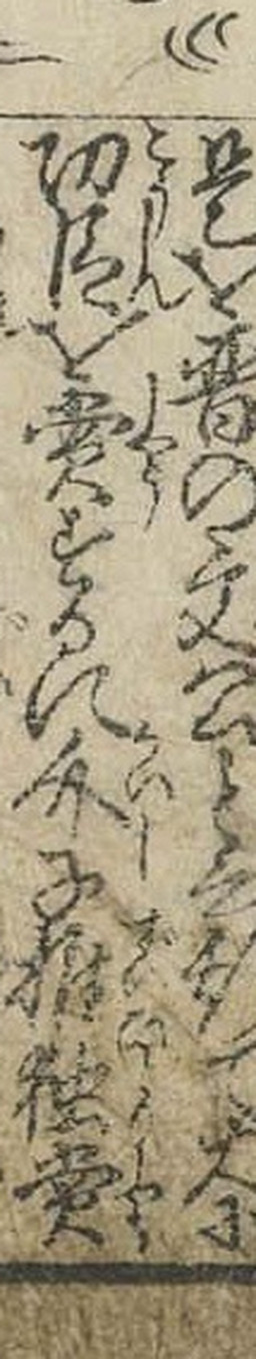功臣を賞するに介子推独賞
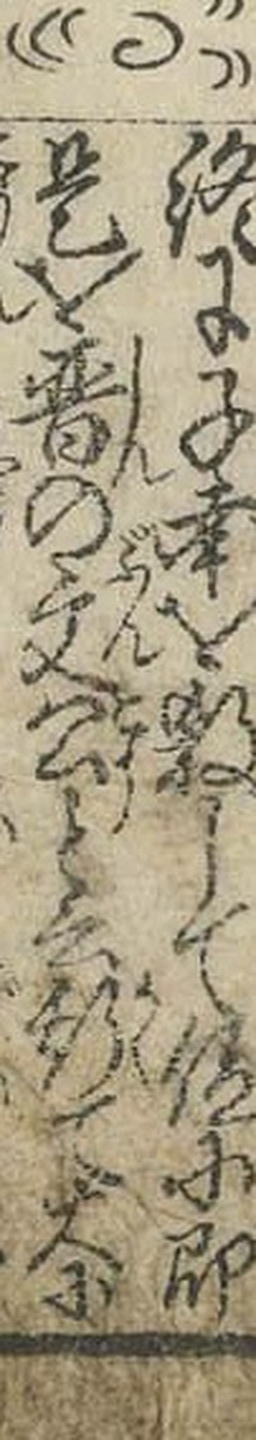是を晋の文公と云斯て大に
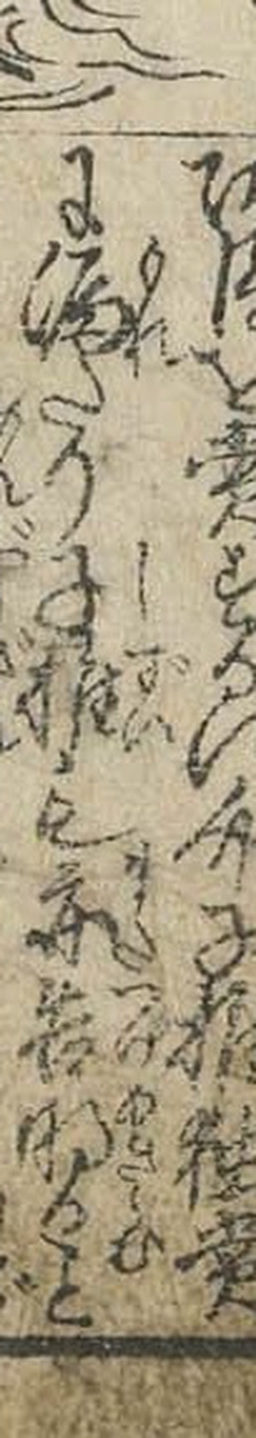に漏たり子推も亦告明ること
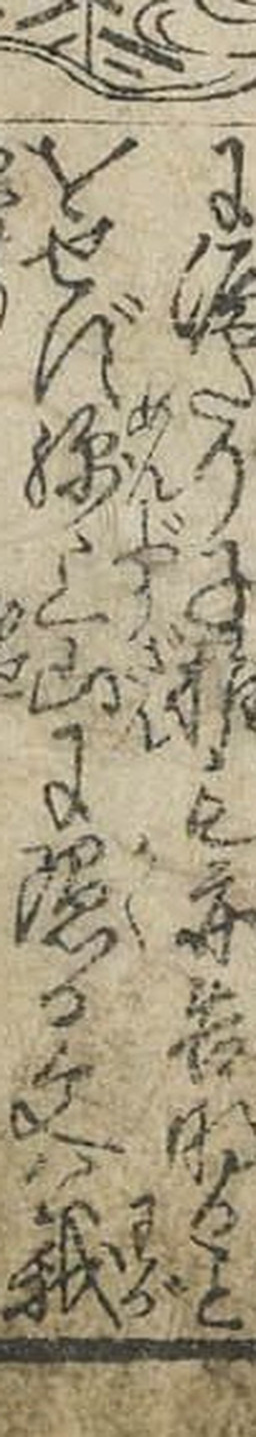をせず綿上山に隠る文は我
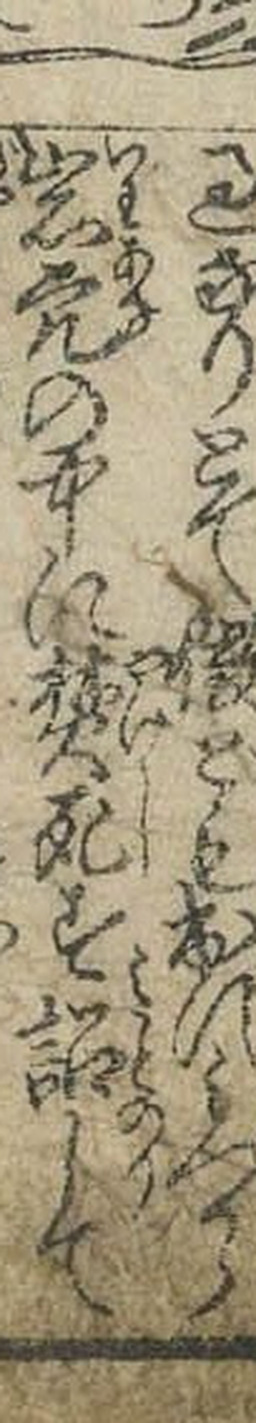岩穴の中に焚死す詔して
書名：絵本写宝袋 9巻 5之巻
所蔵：東京学芸大学教育コンテンツアーカイブ
